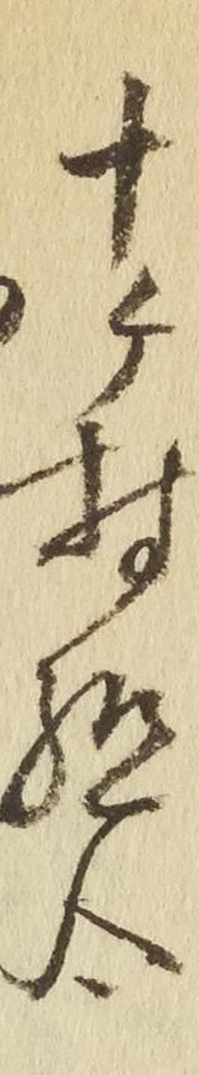十ヶ村組合
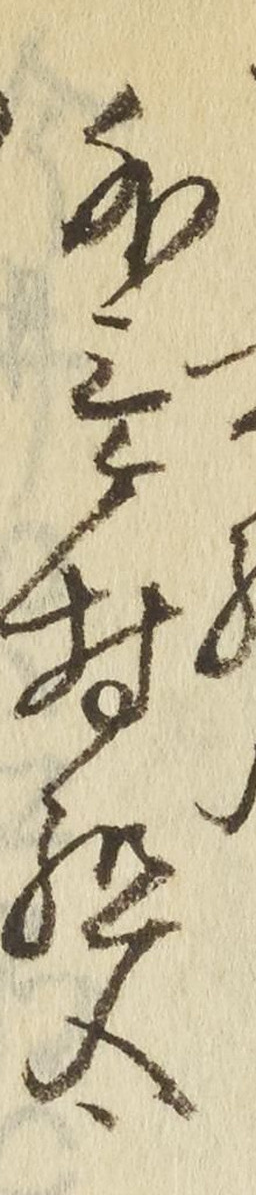外三ケ村組合
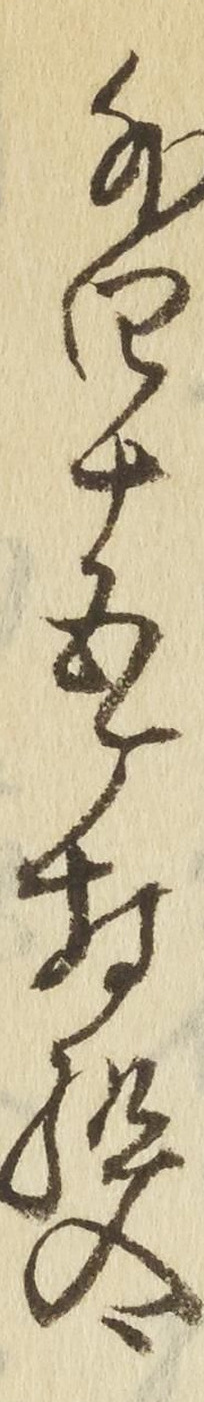外四十五ケ村組合
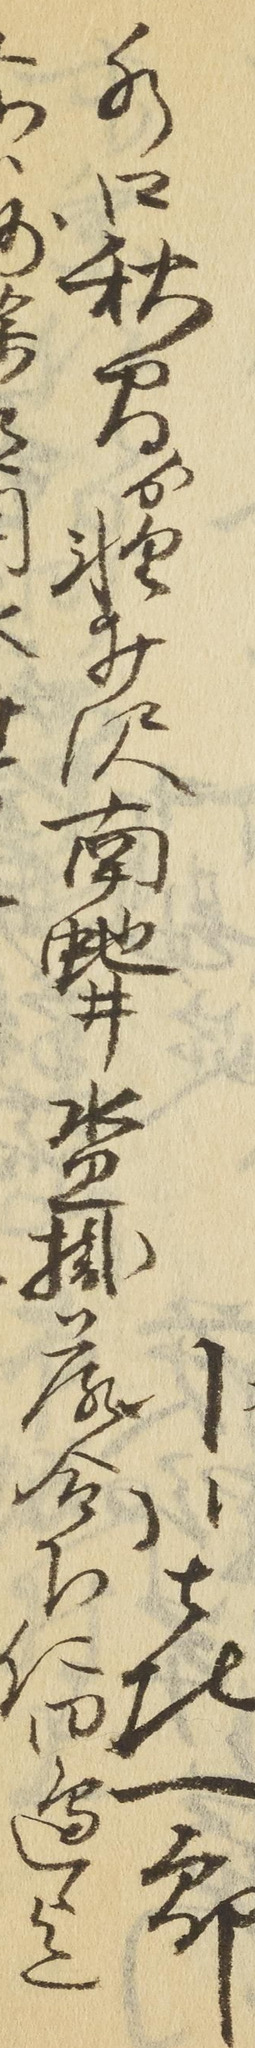水口秋間ゟ軽井沢南虵井沓掛落合下仁田辺迄
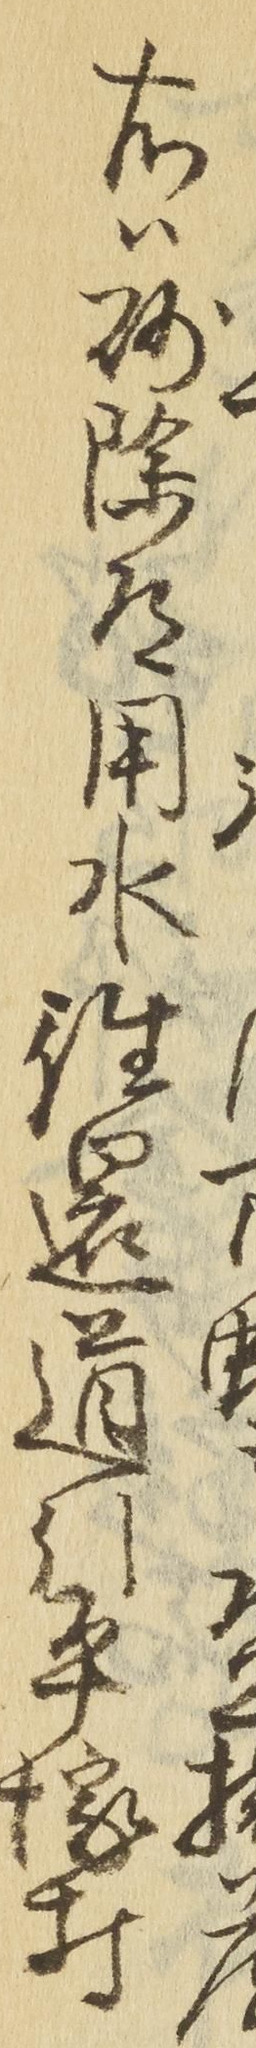右は砂除道用水往還通行平塚村
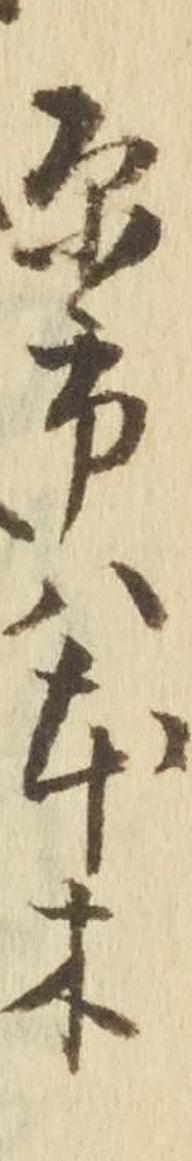原市八本木
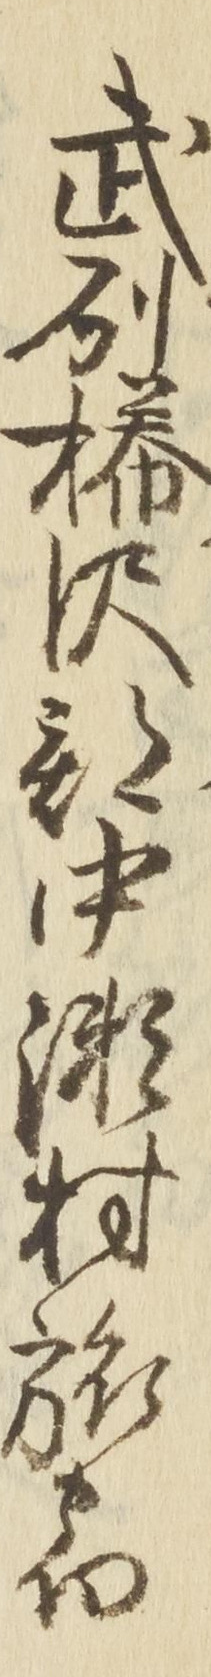武州榛沢郡中瀬村旅宿
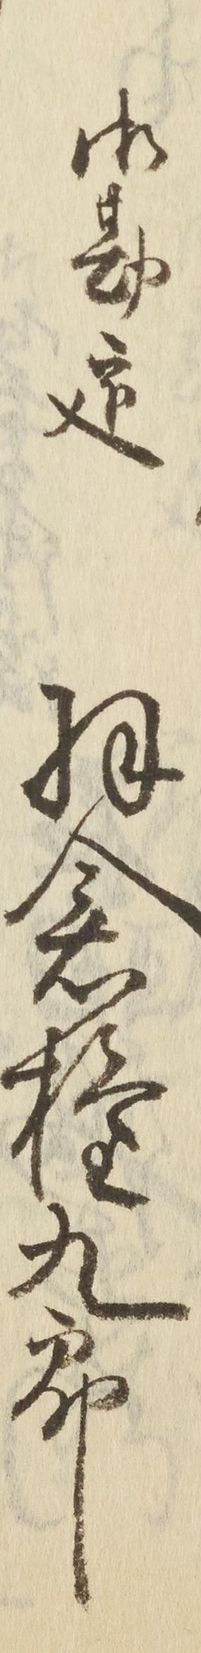御勘定羽倉権九郎
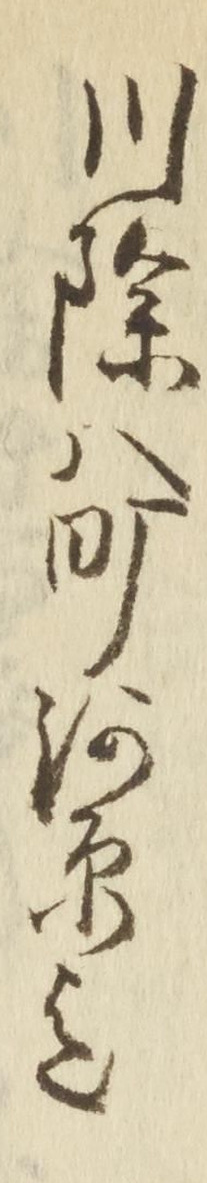川除ケ八町河原迄
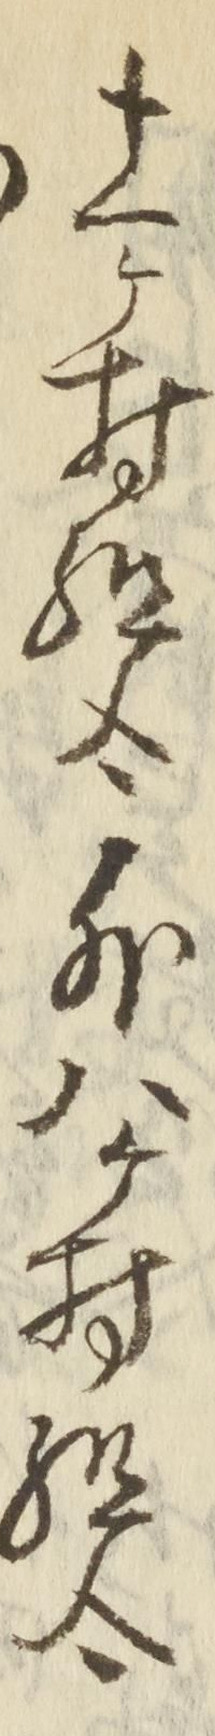拾一ヶ村組合外八ケ村組合
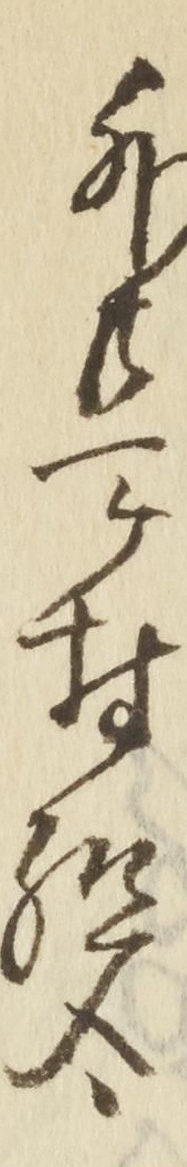外十一ケ村組合
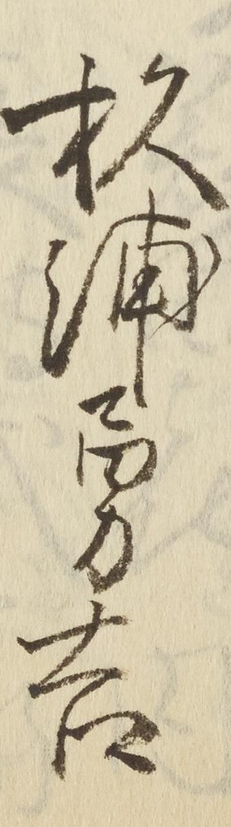杉浦勇吉
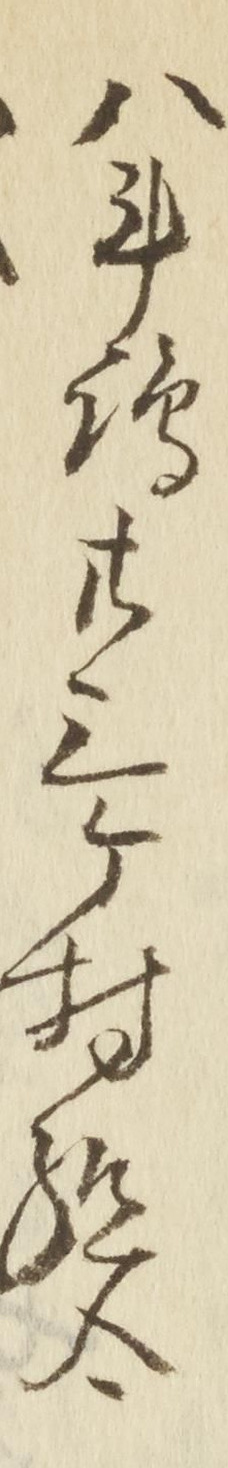八斗嶋廿三ケ村組合
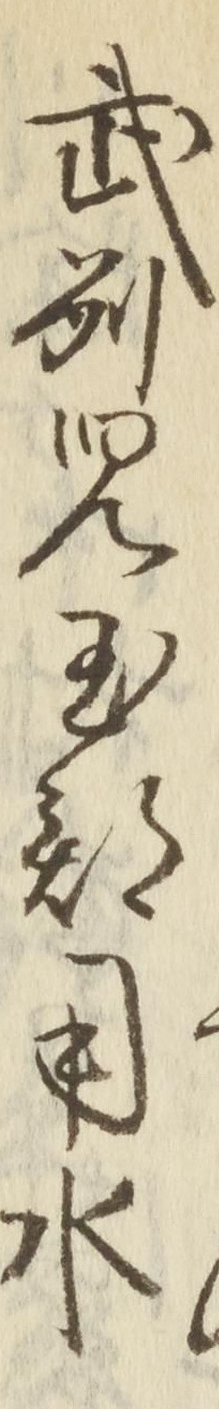武州児玉郡用水
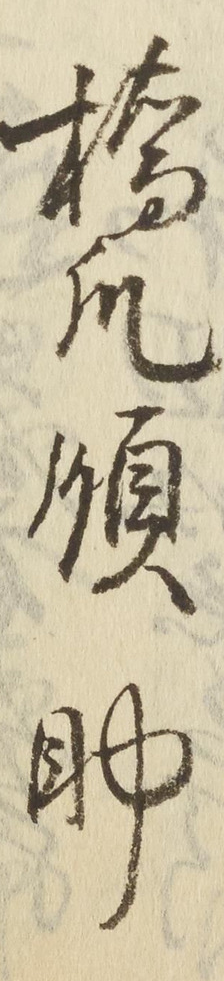橋爪順助
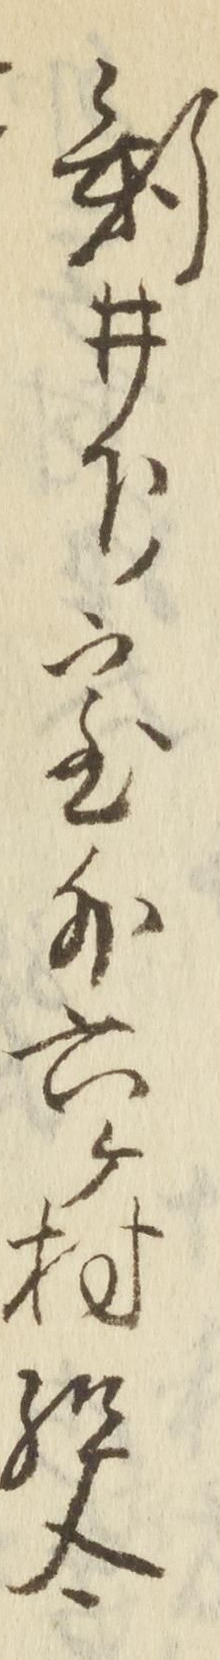新井下室外六ケ村組合
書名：浅間大變記
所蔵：東京大学地震研究所図書室 Earthquake Research Institute Library, The University of Tokyo, JAPAN
